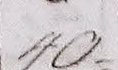40
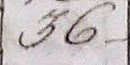36
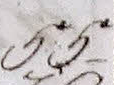55
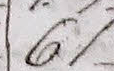61
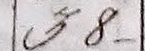38
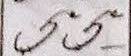55
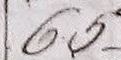65
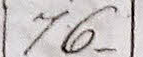76
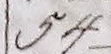54
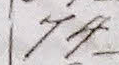74
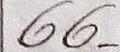66
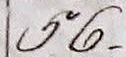56
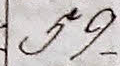59
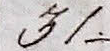31
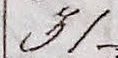31
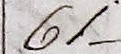61
